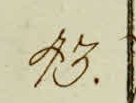43.
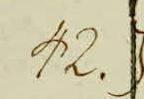42.
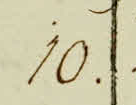10.
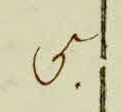5.
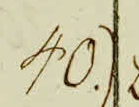40.
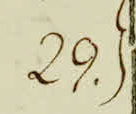29.
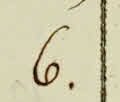6.
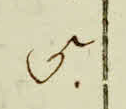5.
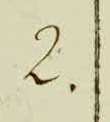2.
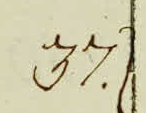37.
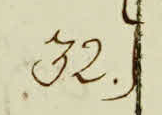32.
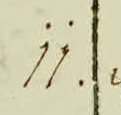11.
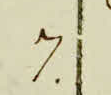7.
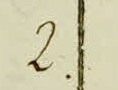2.
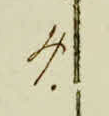4.
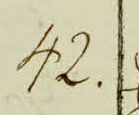42.
